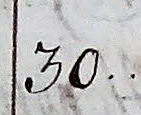30.
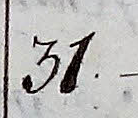31.
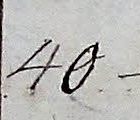40.
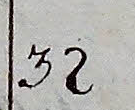32
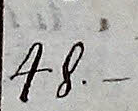48.
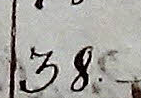38.
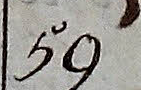59
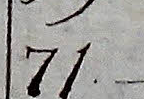71.
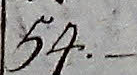54.
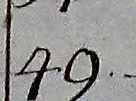49
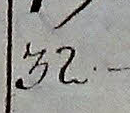32
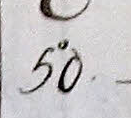50.
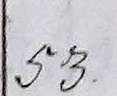53
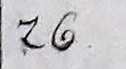26
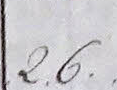26
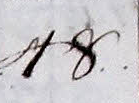48.
